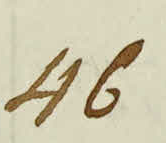46
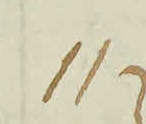11
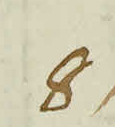8
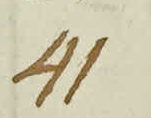41
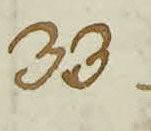33
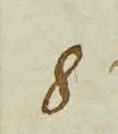8
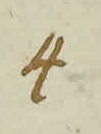4
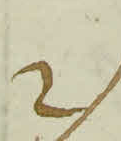2
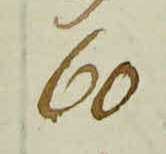60
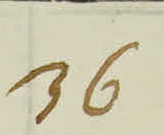36
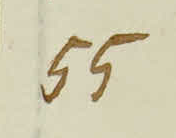55
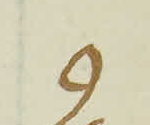9
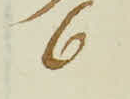6
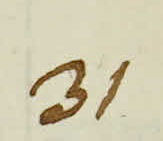31
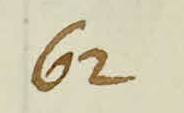62
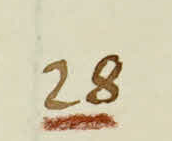28
